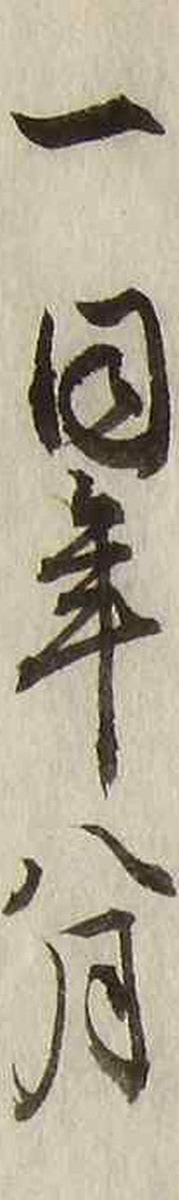一同年八月
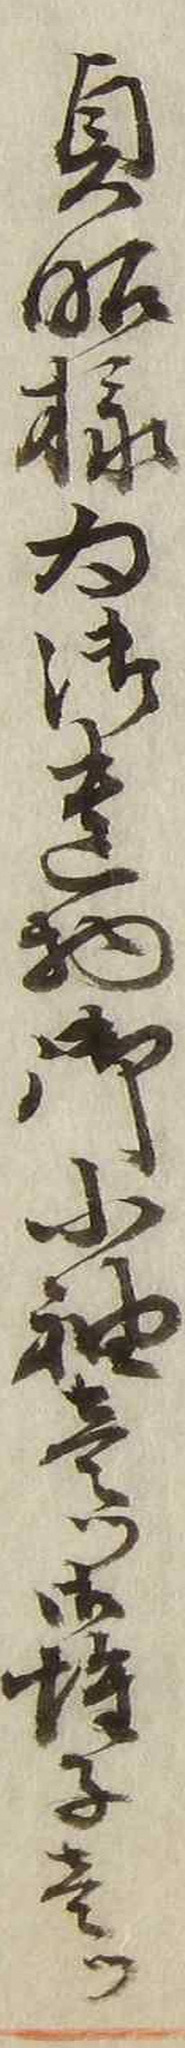貞昭様為御遺物御小袖壱ツ御帷子壱ツ

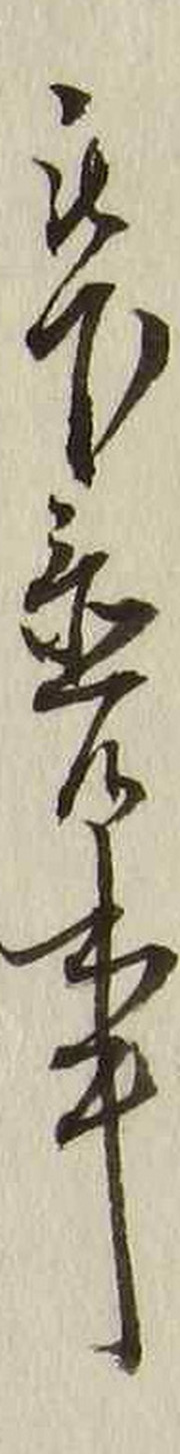被下置候事
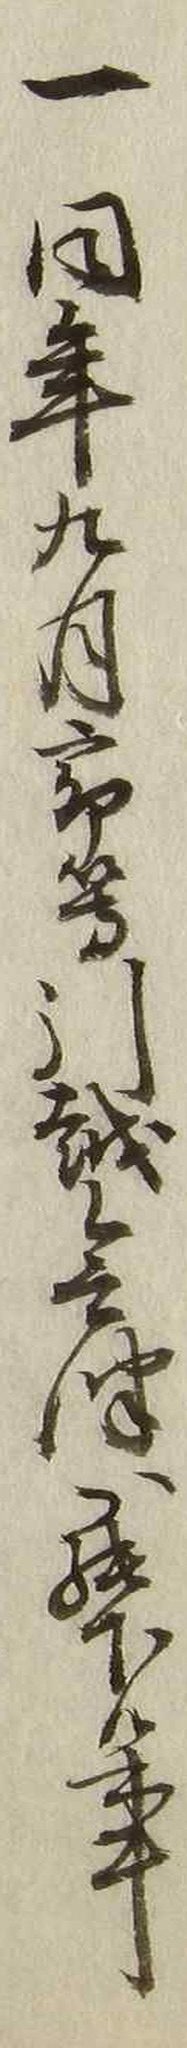一同年九月郎等引越会津へ罷下候事
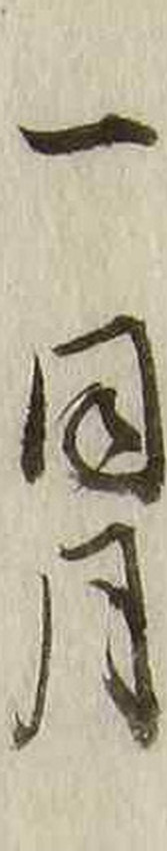一同月
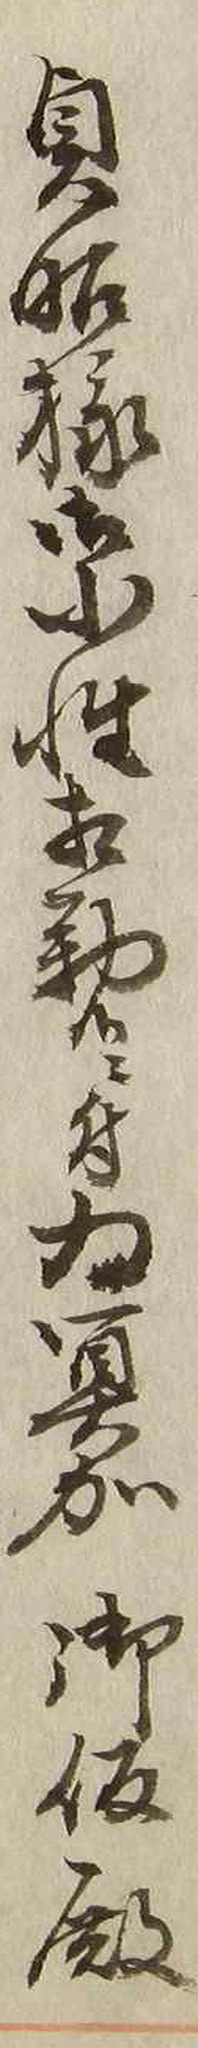貞昭様御小性相勤候ニ付為冥加御仮殿
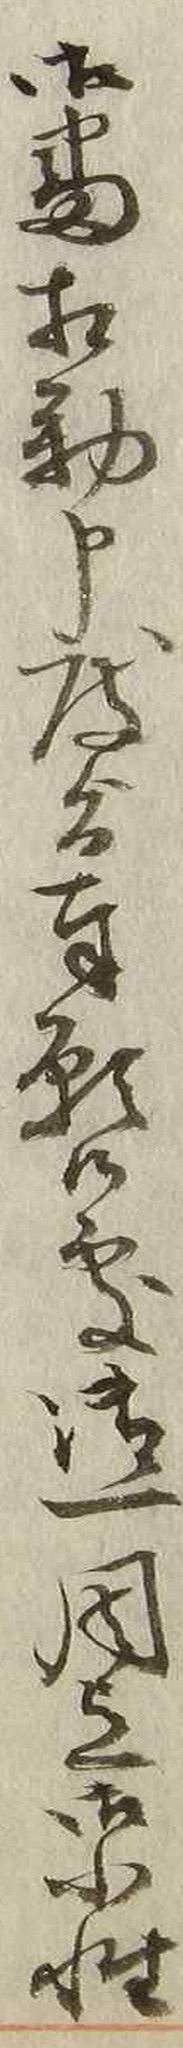御番相勤申度旨奉願候処御一周迄御小性
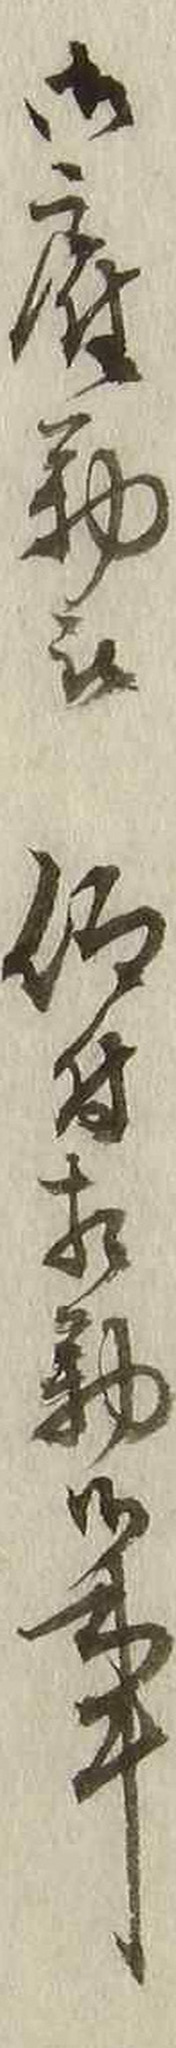御雇勤被仰付相勤候事
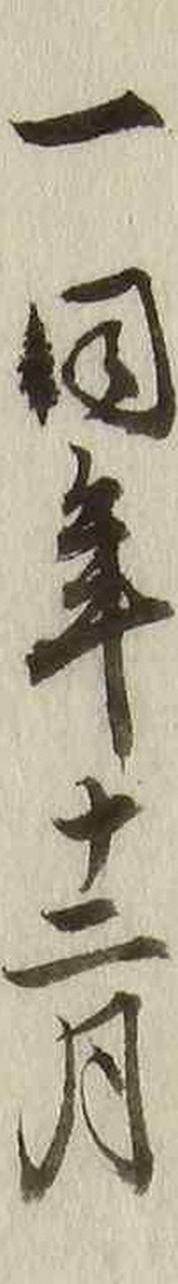一同年十二月
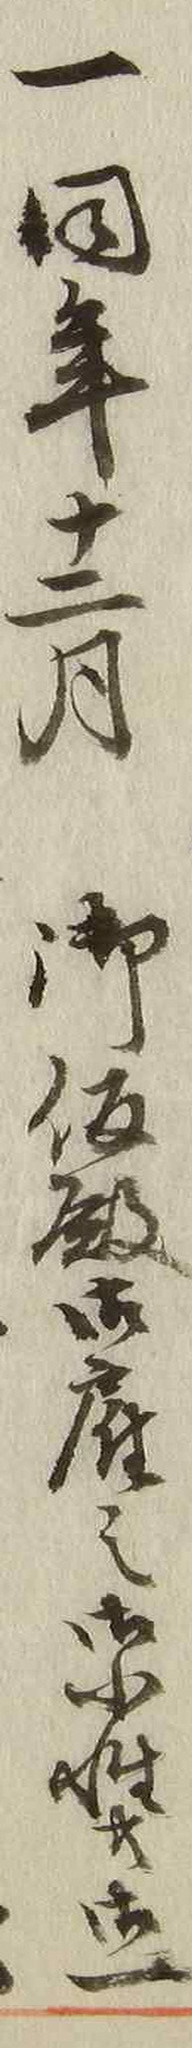一同年十二月御仮殿御雇之御小性共御一
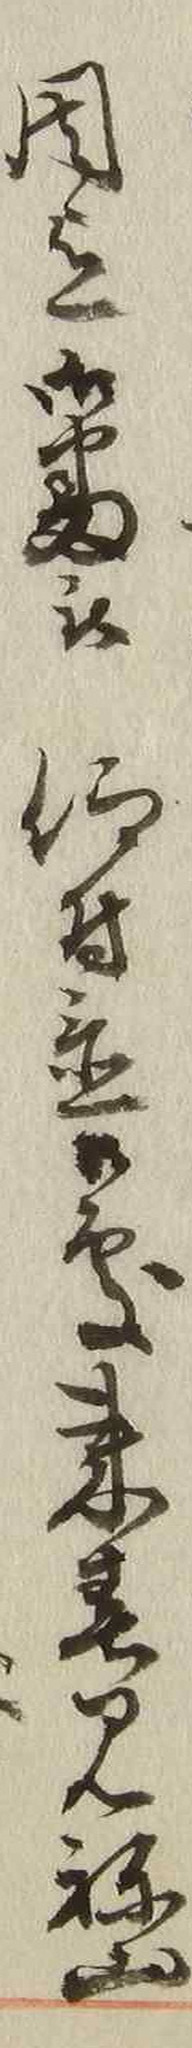周迄御番被仰付置候処来春見祢山
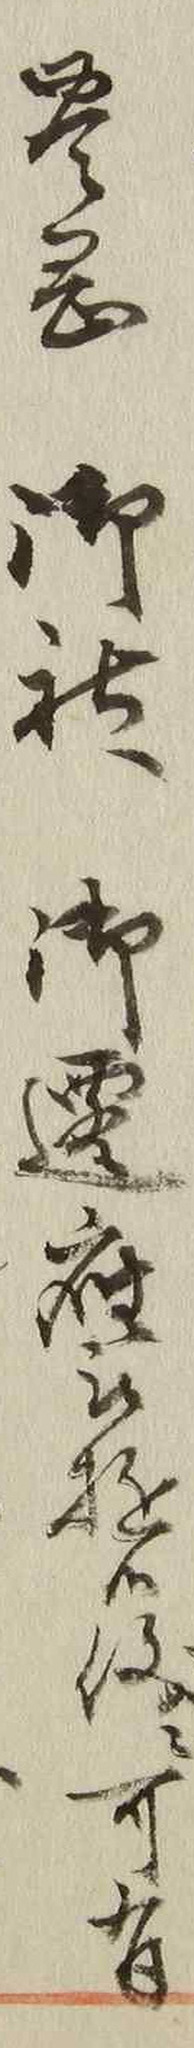豊岡御社へ御遷座被遊候儀ニ可有
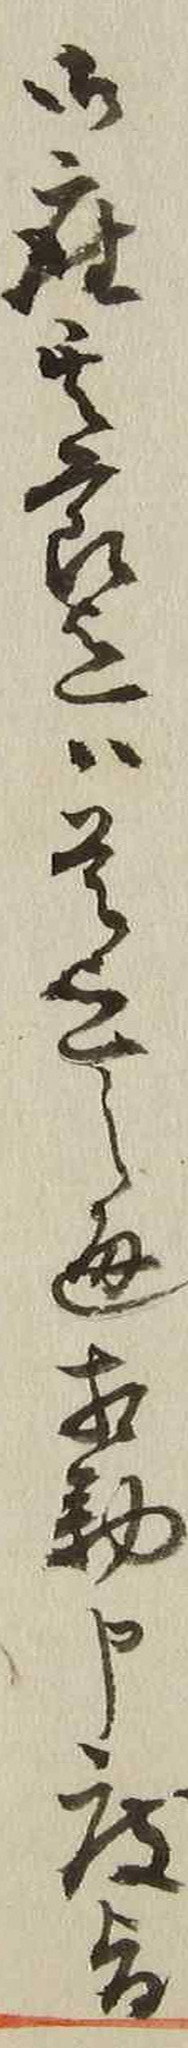御座其節迄ハ是迄之通相勤申度旨
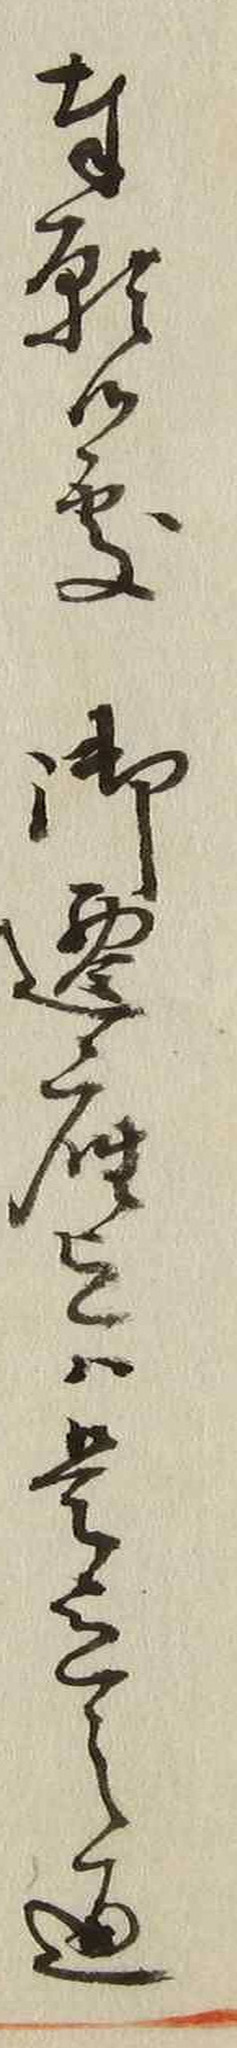奉願候処御遷座迄ハ是迄之通
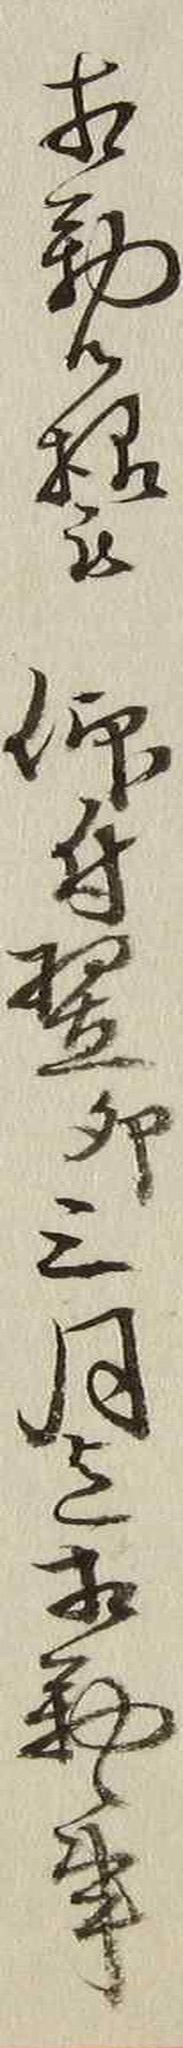相勤候様被仰付翌卯三月迄相勤候事
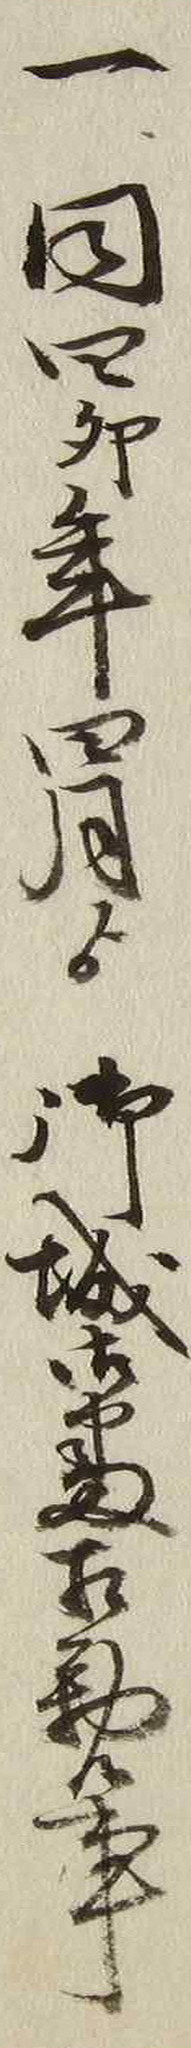一同四卯年四月ゟ御城御番相勤候事
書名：諸士系譜　巻之23　い之部23
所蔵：会津若松市立会津図書館
